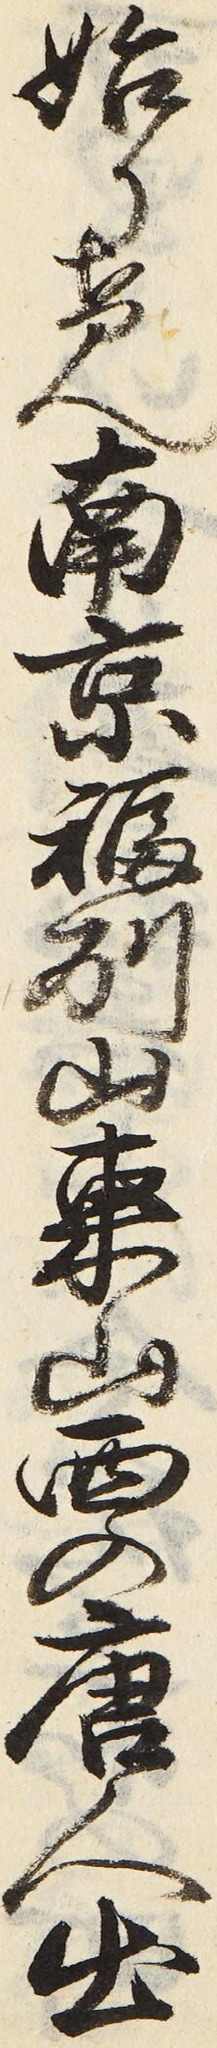始りけん南京福州山東山西の唐人出
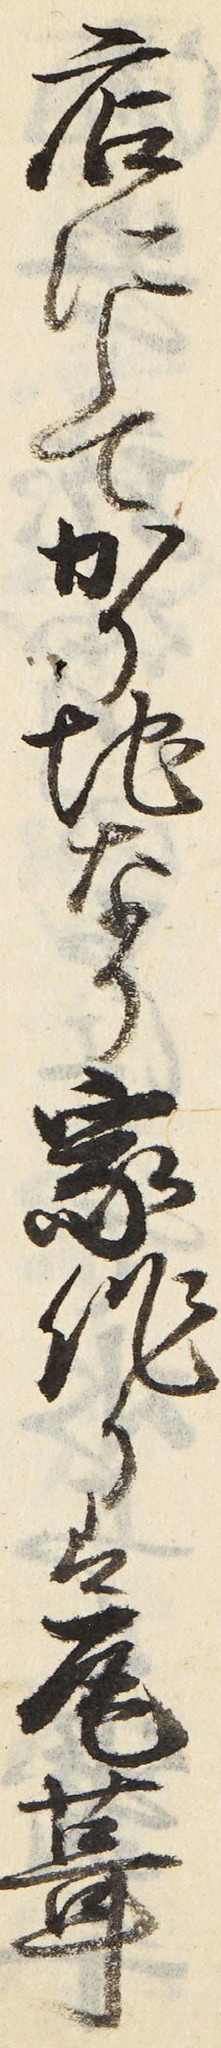店にしてかり地なり家作りは瓦葺
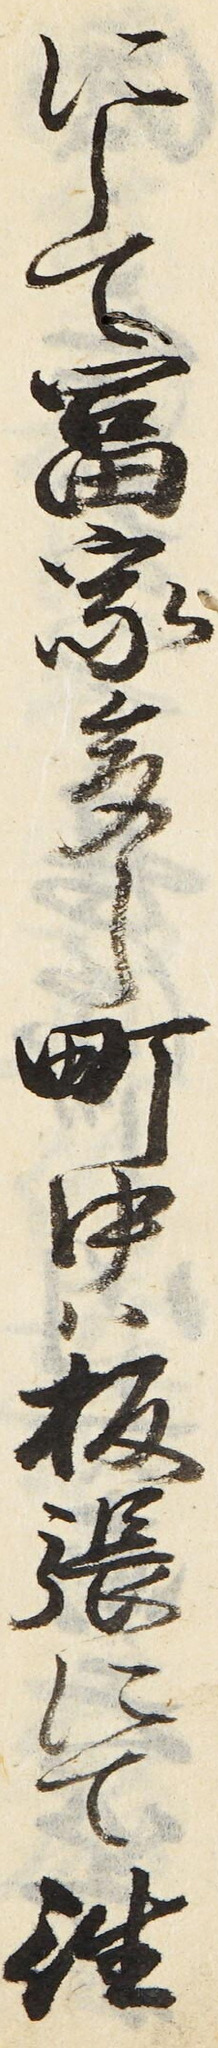にして冨家多し町中は板張にて往
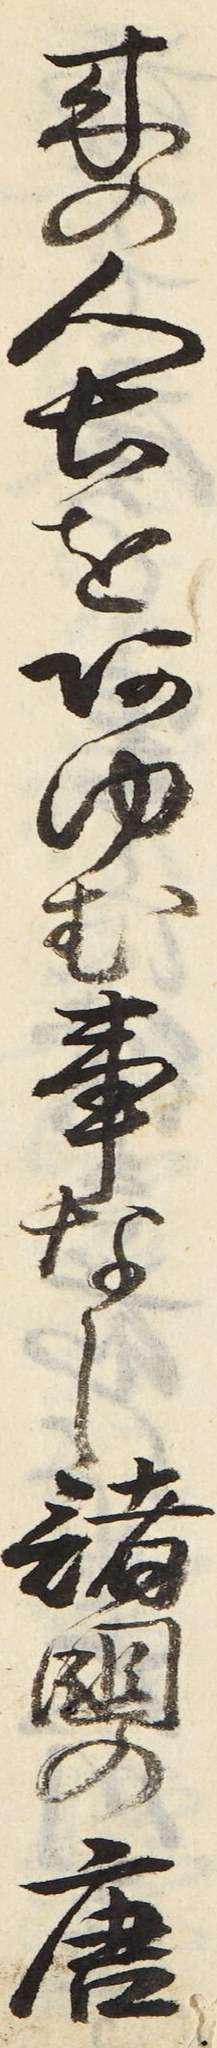来の人土をあゆむ事なし諸国の唐
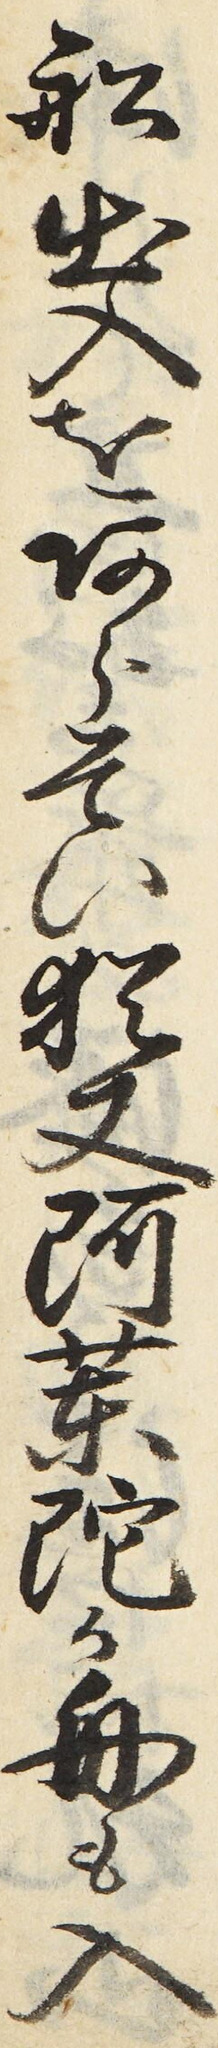船出入をあらそひ猶又阿蘭陀か舟も入

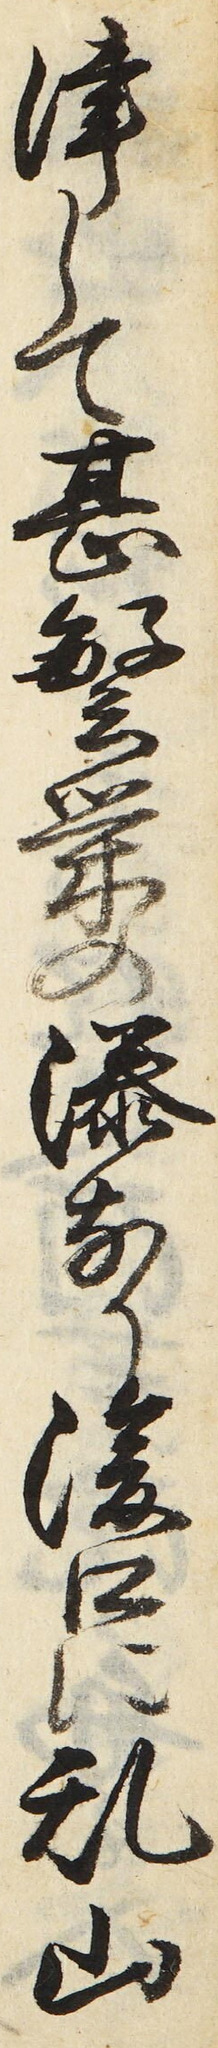津して甚繁栄の湊なり後ろに乱山
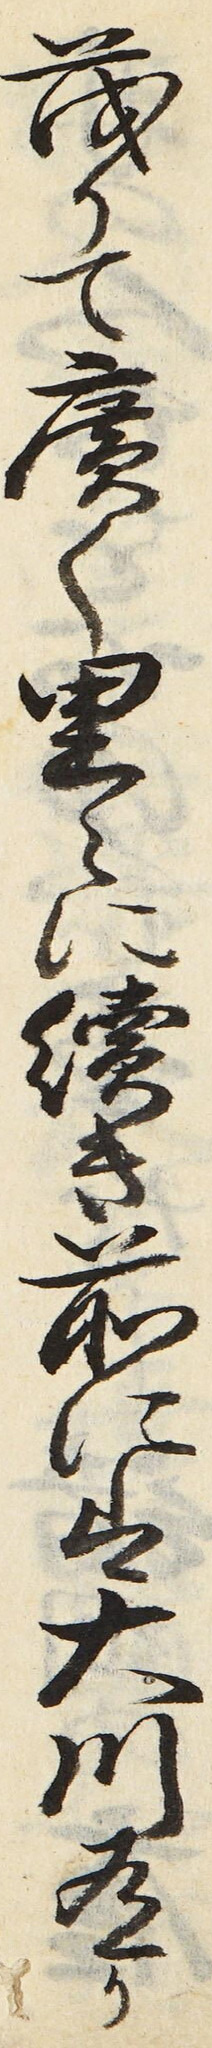茂りて広く里々に続き前には大川有り
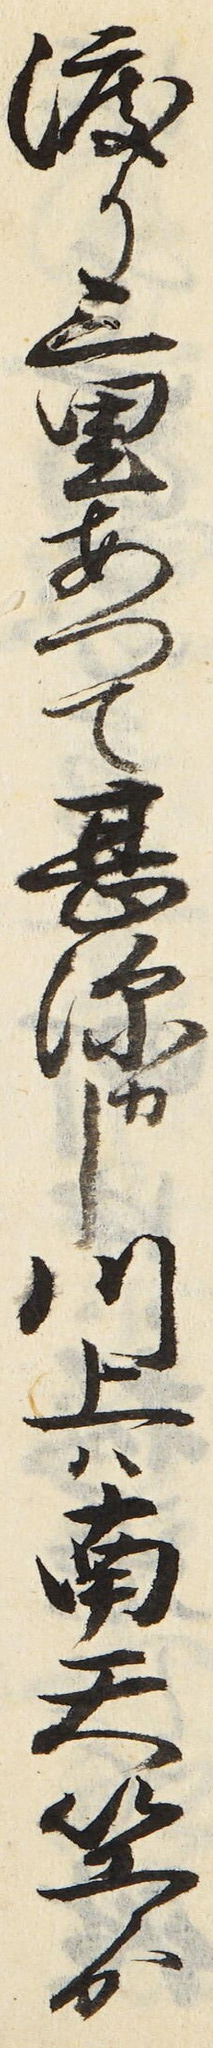渡り三里あつて甚深かし川上は南天竺ゟ
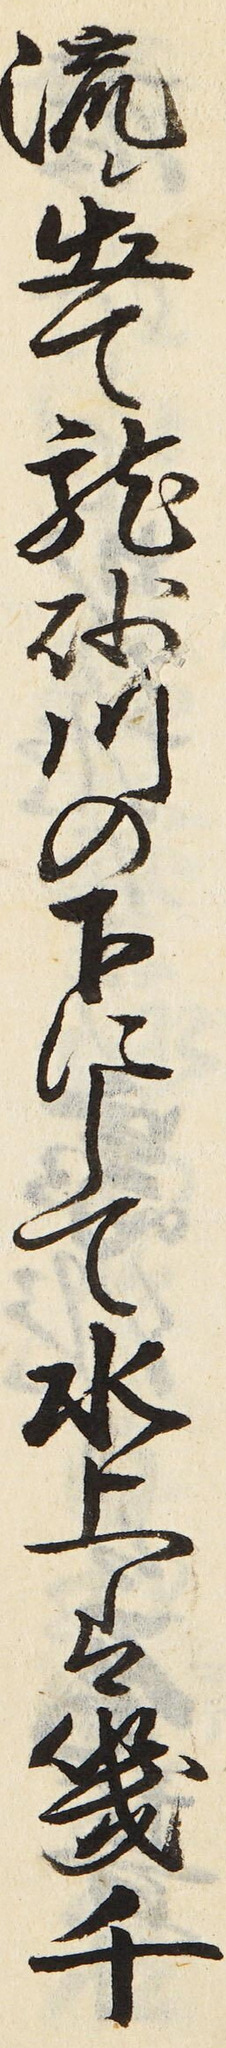流れ出て龍砂川の下にして水上は幾千
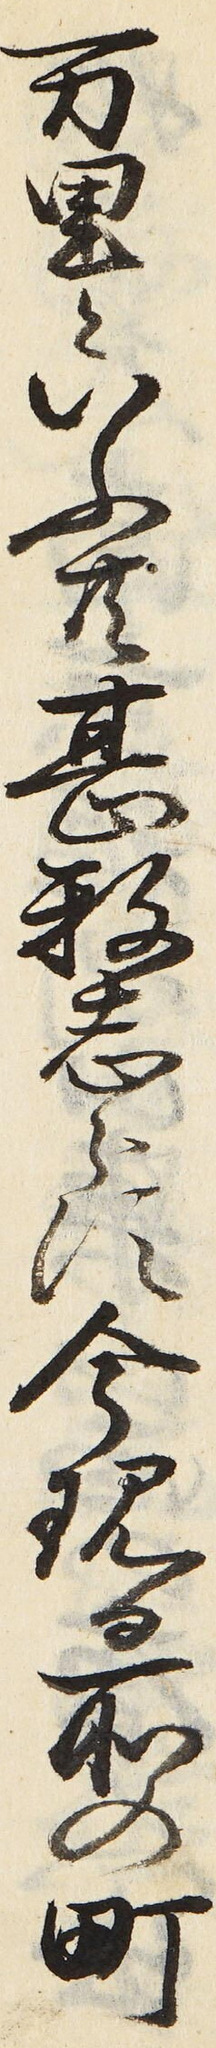万里といふ共甚数しらす今現る所の町
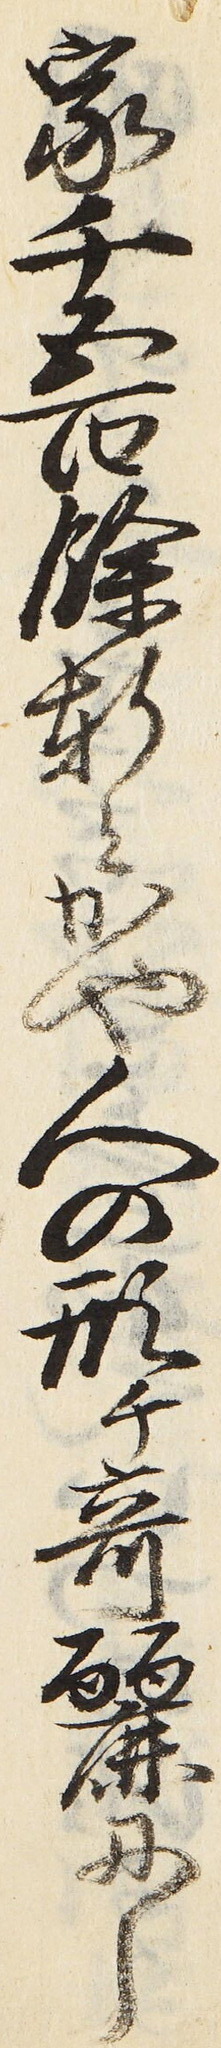家千五百余軒とかや人の形ち奇麗にし
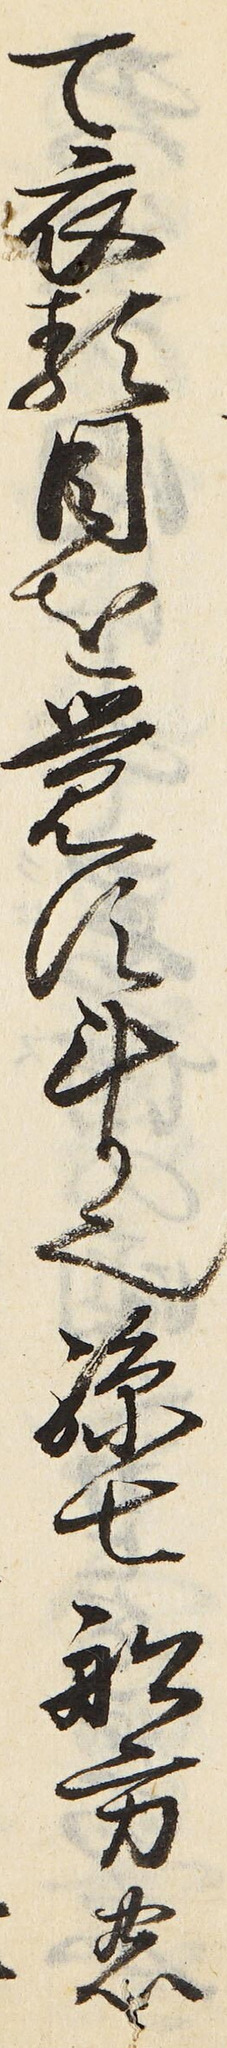て衣類目を覚す計り也孫七船方の
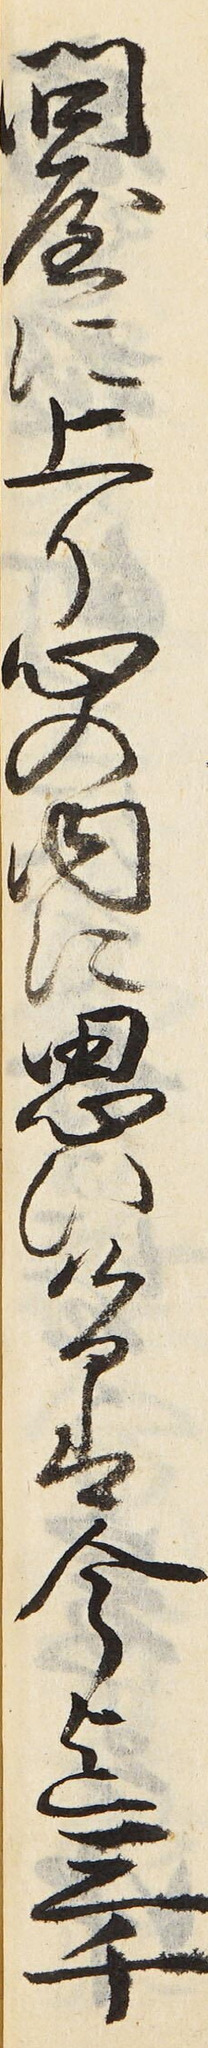問屋に上り心の内に思ひけるは今迠三千
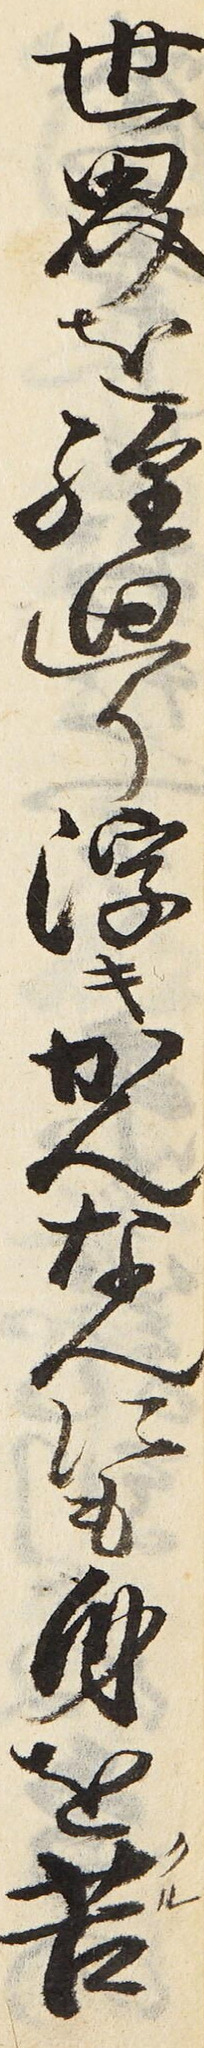世界を経廻り浮きかんなんにも身を苦
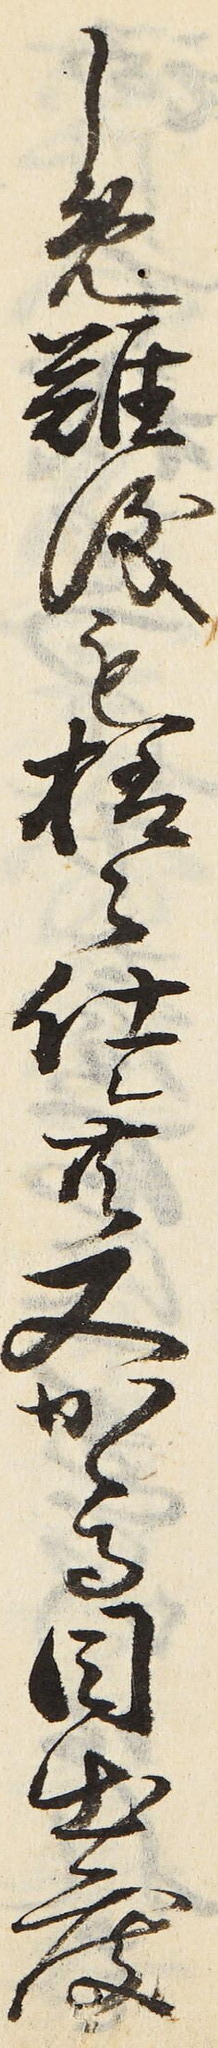しめ難儀も様々仕れ共又かゝる目出度
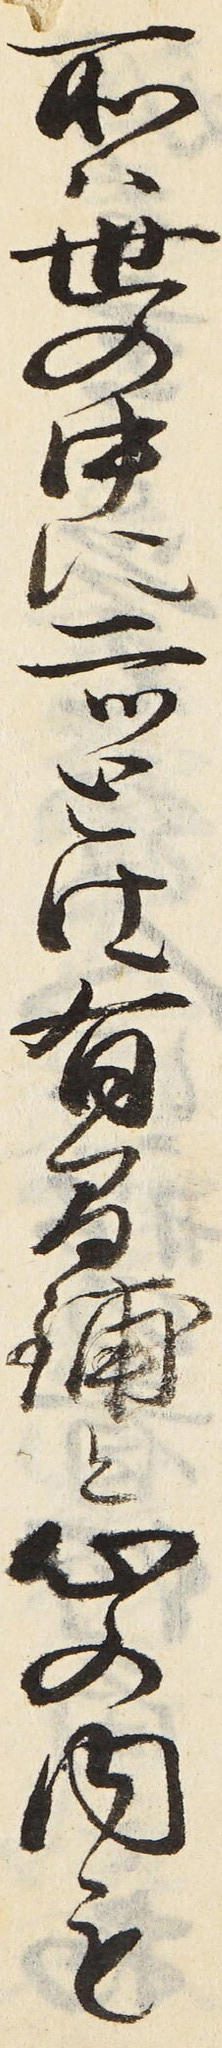所は世の中に二つとは有間鋪と心の内も
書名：華夷九年録
